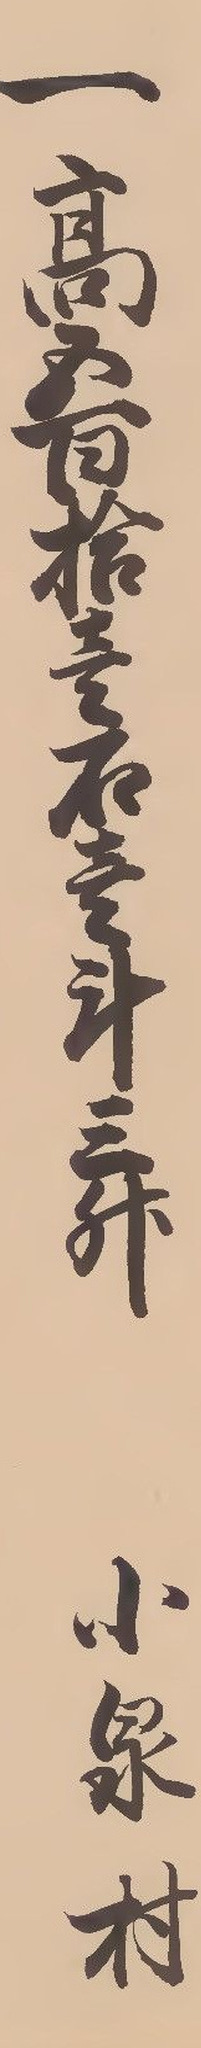一高五百拾壱石壱斗三升小泉村
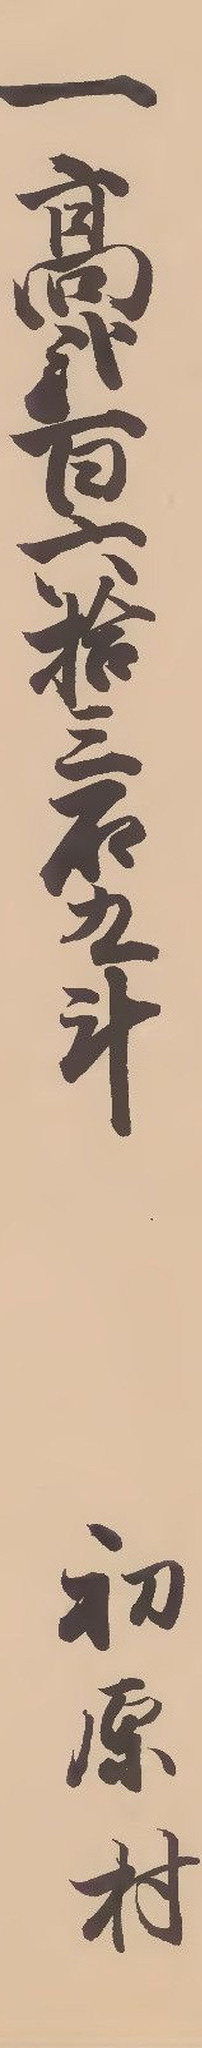一高弐百六拾三石九斗初原村
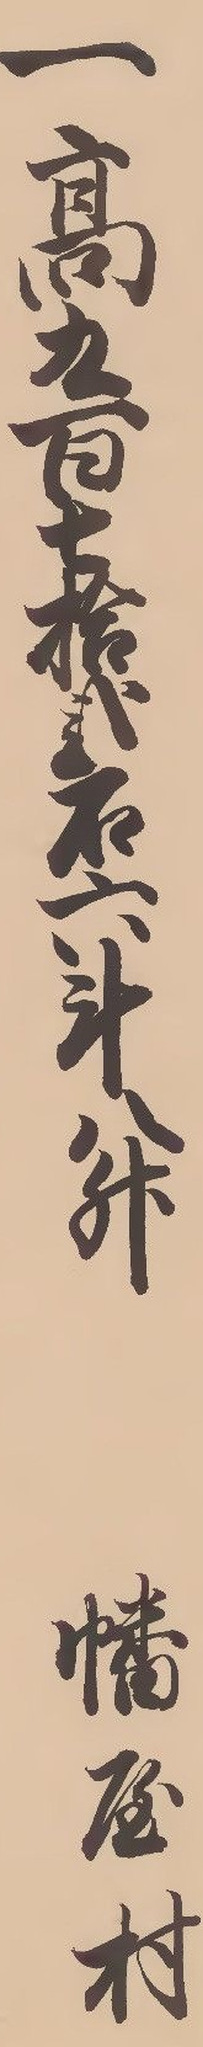一高九百七拾弐石六斗八升幡屋村
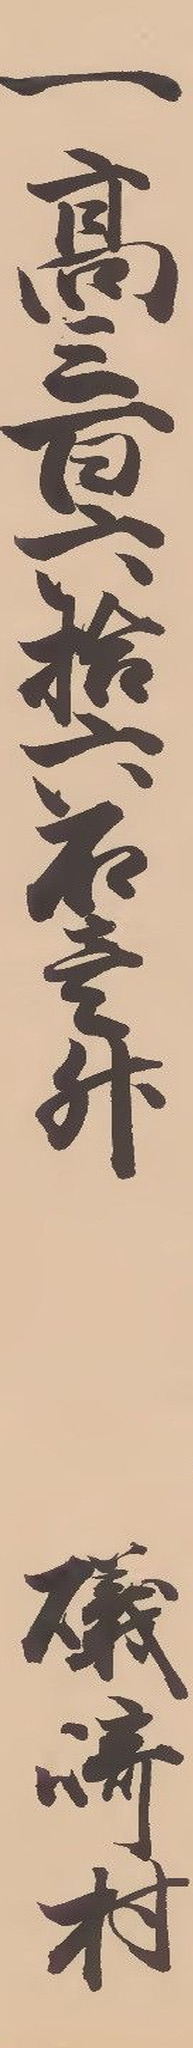一高三百六拾六石壱升磯崎村
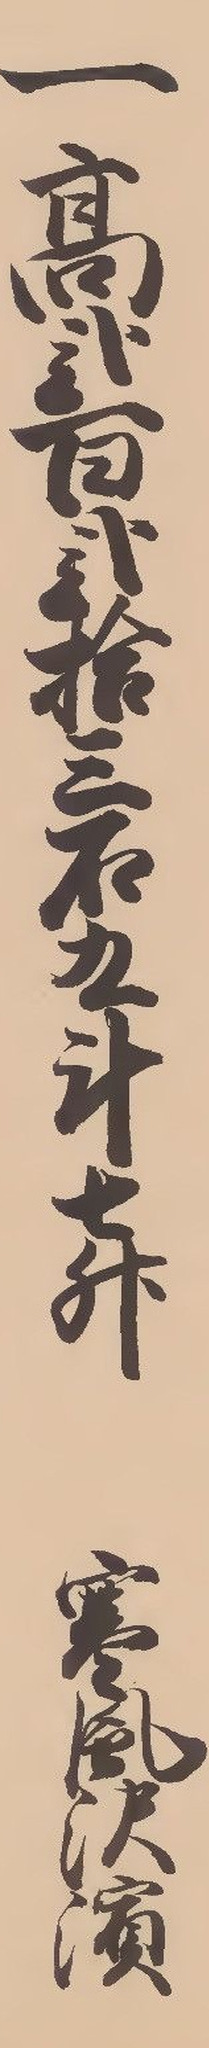一高弐百弐拾三石九斗七升寒風沢浜
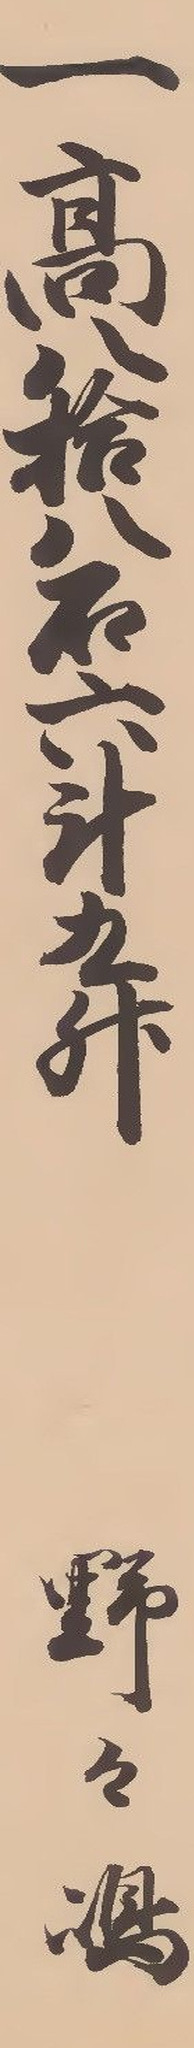一高八拾八石六斗九升野々島
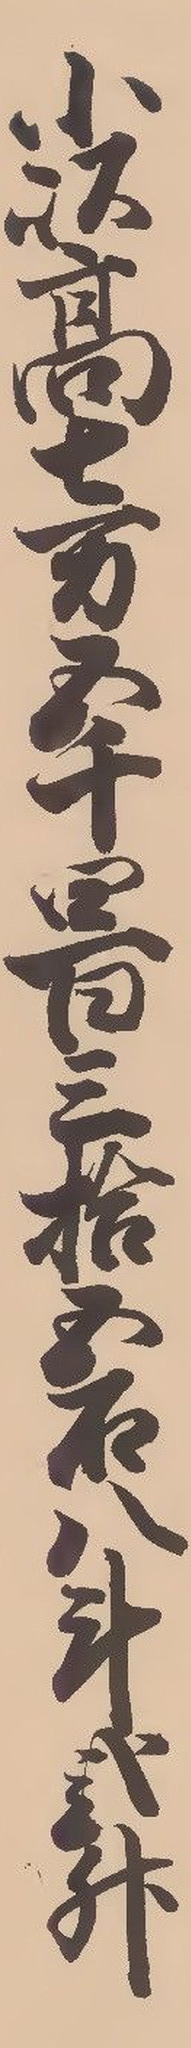小以高七万五千四百三拾五石八斗弐升

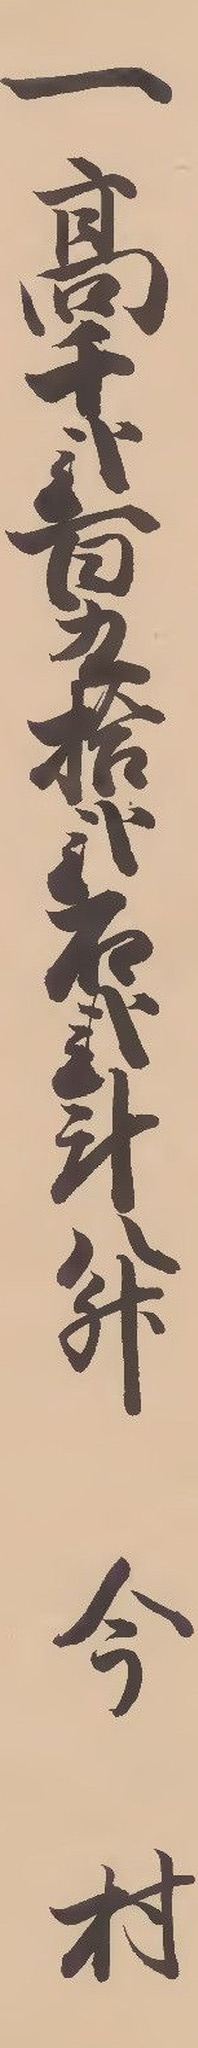一高千弐百九拾弐石弐斗八升今村
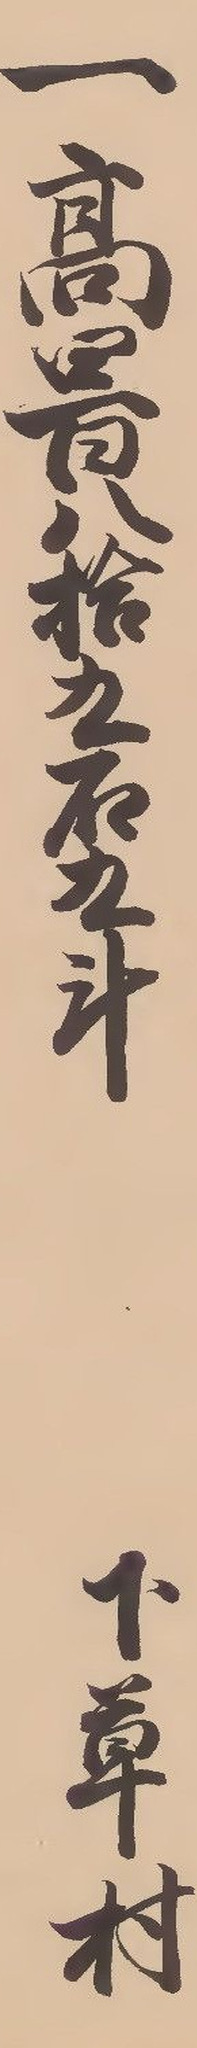一高四百八拾九石九斗下草村

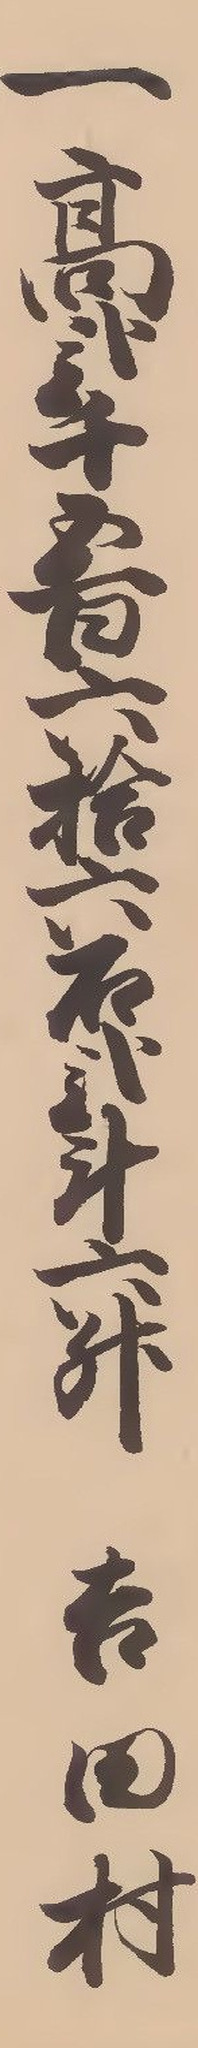一高弐千五百六拾六石弐斗六升吉田村
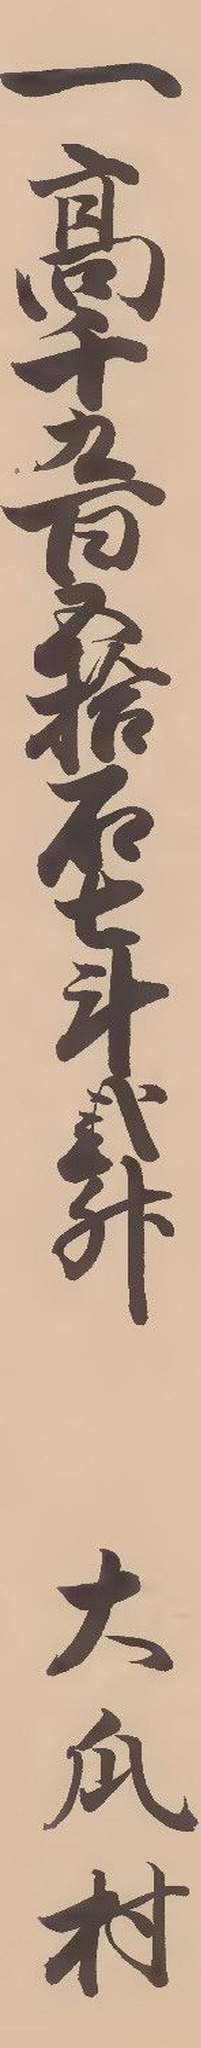一高千九百五拾石七斗弐升大瓜村
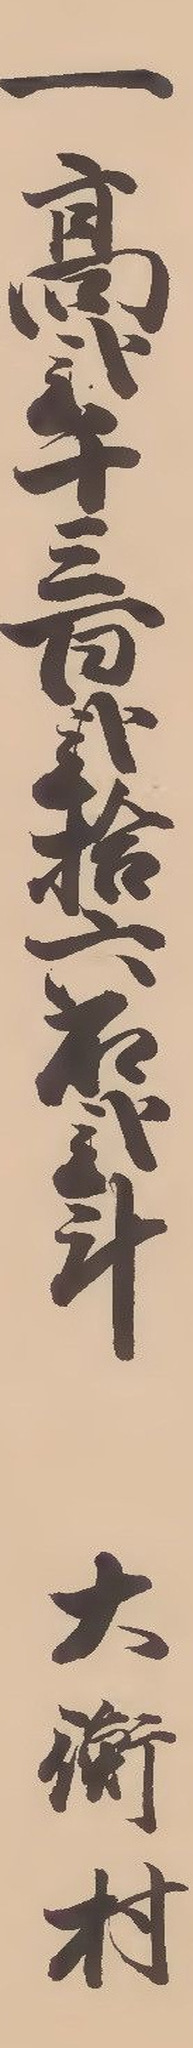一高弐千三百弐拾六石弐斗大衡村
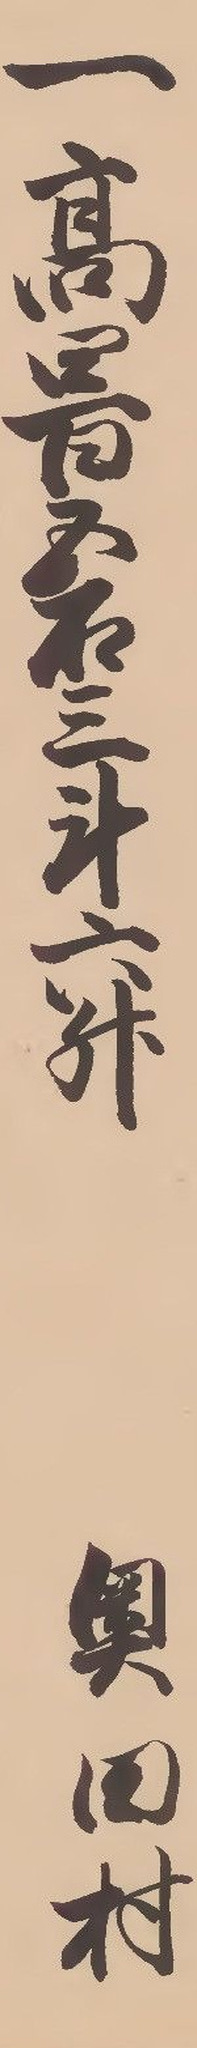一高四百五石三斗六升奥田村
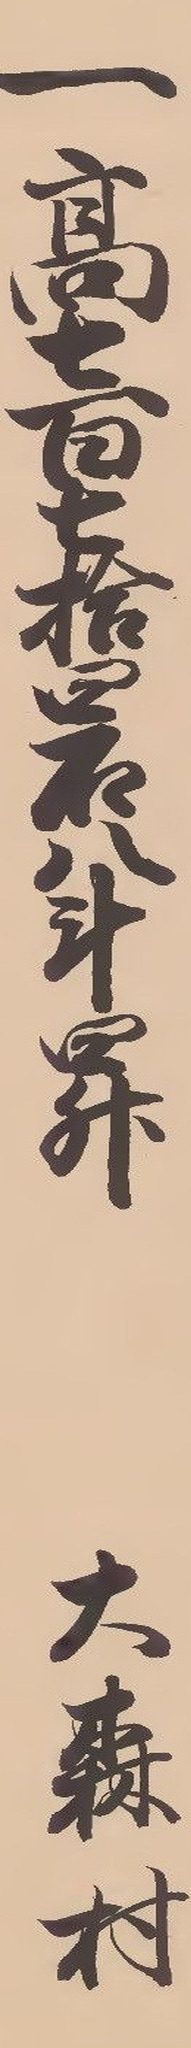一高七百七拾四石八斗四升大森村
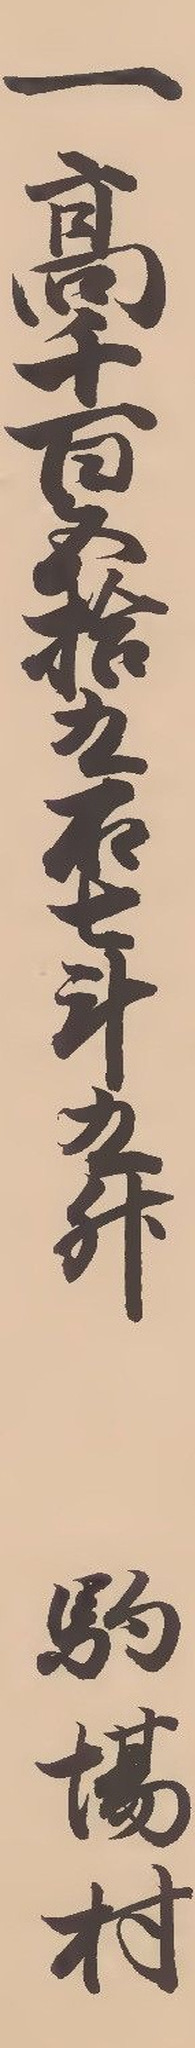一高千百五拾九石七斗九升駒場村
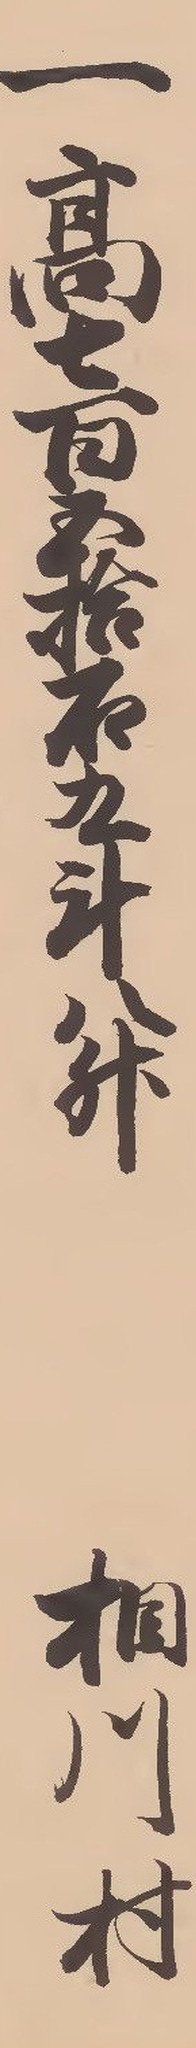一高七百五拾石九斗八升相川村
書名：陸奥国郷帳　５
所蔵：国立公文書館 National Archives of Japan
